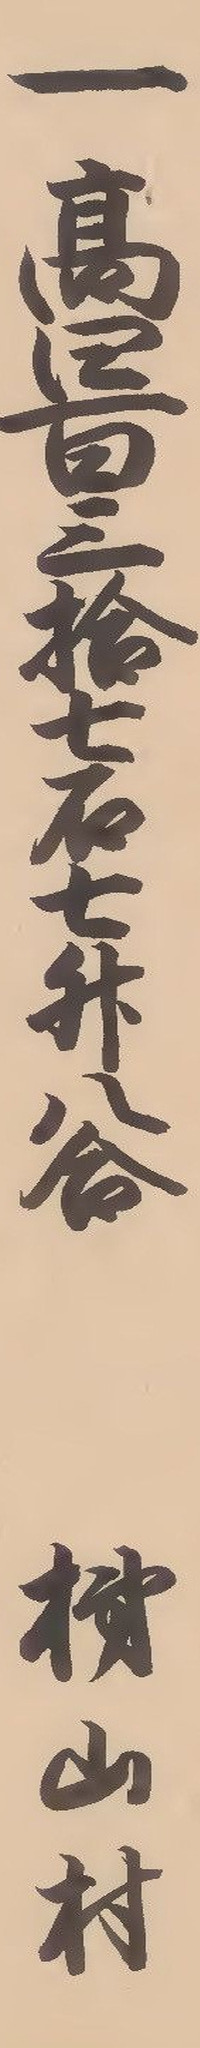一高四百三拾七石七升八合柿山村
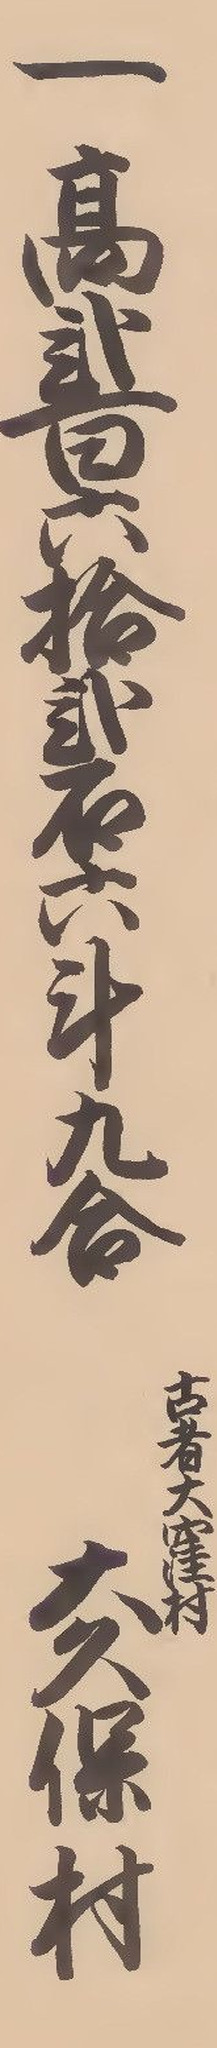一髙弐百六拾弐石六斗九合大久保村

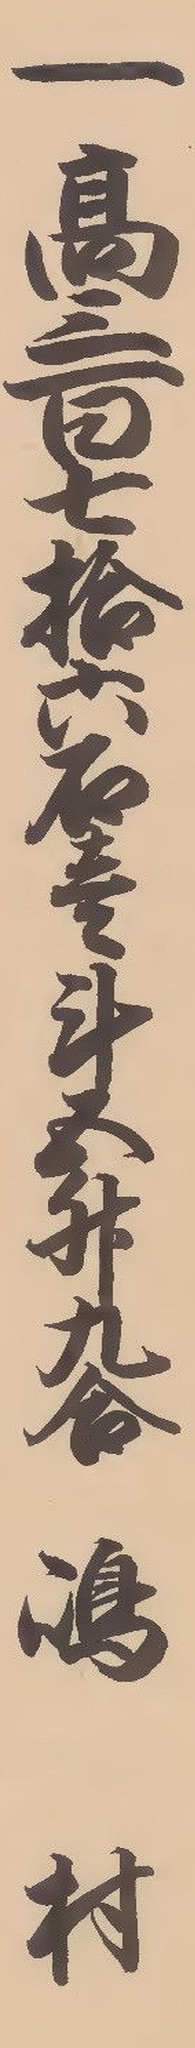一髙三百七拾六石壱斗五升九合嶋村
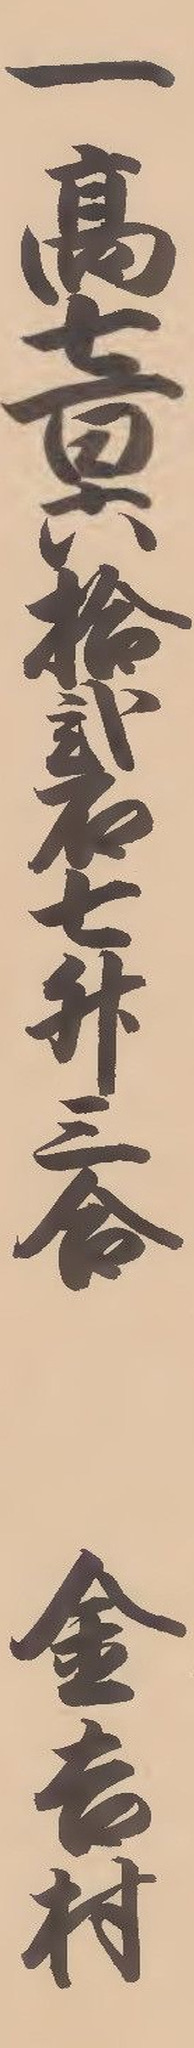一髙七百六拾壱石七升三合金吉村
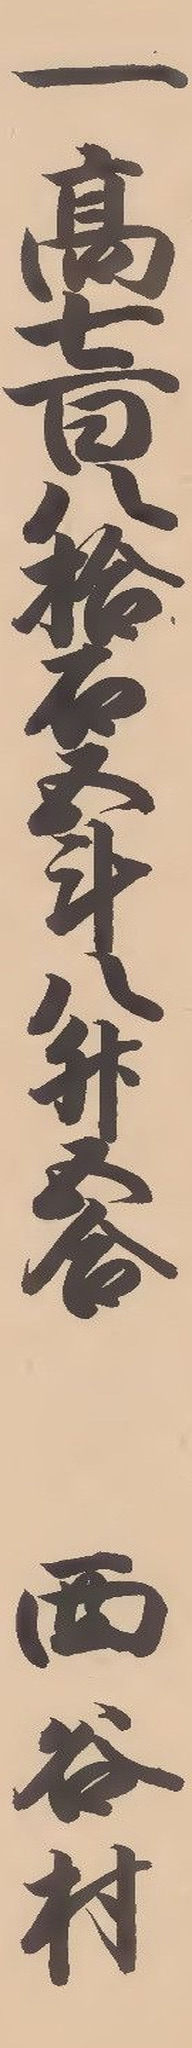一髙七百八拾石五斗八升五合西谷村
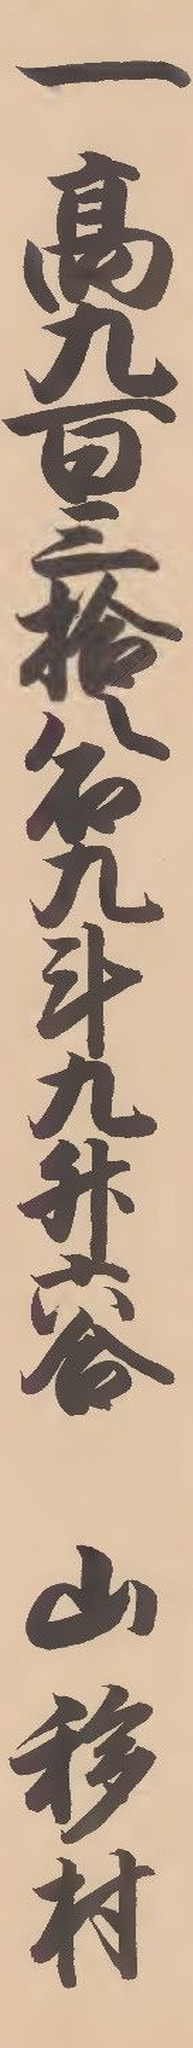一髙九百三拾八石九斗九升六合山移村
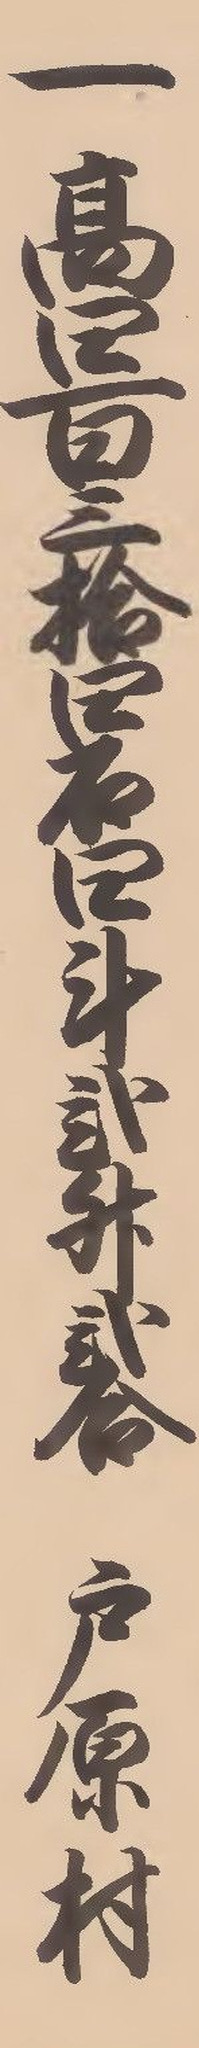一髙四百三拾四石四斗弐升弐合戸原村
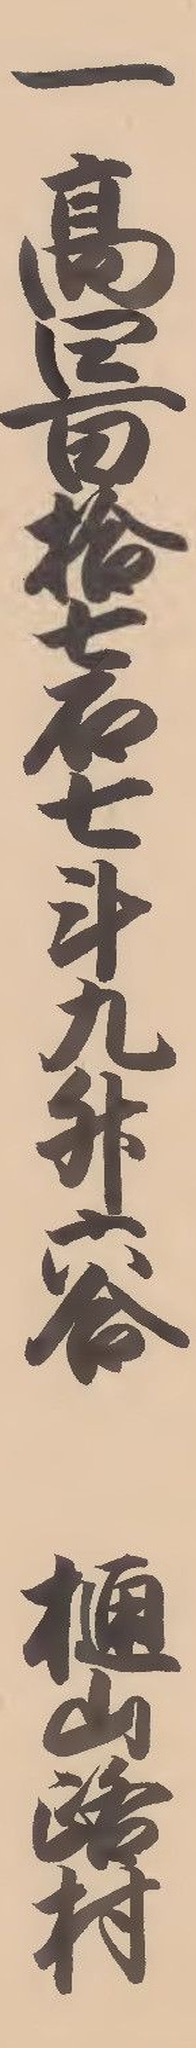一髙四百拾七石七斗九升六合樋山路村
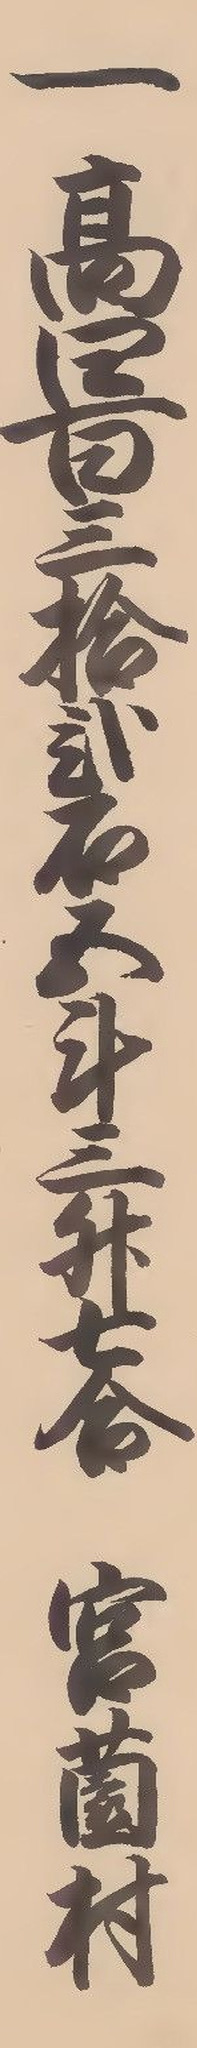一髙四百三拾弐石五斗三升七合宮薗村
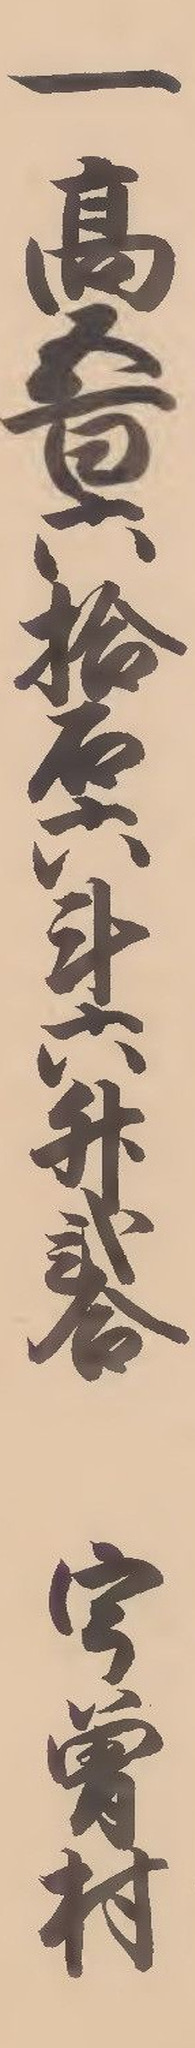一髙五百六拾石六斗六升弐合宇曽村

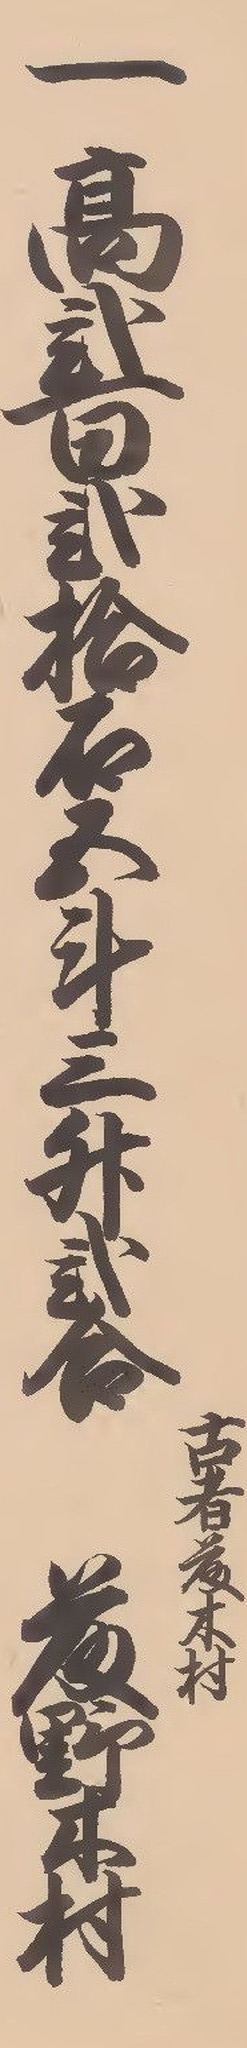一髙弐百弐拾石五斗三升弐合藤野木村
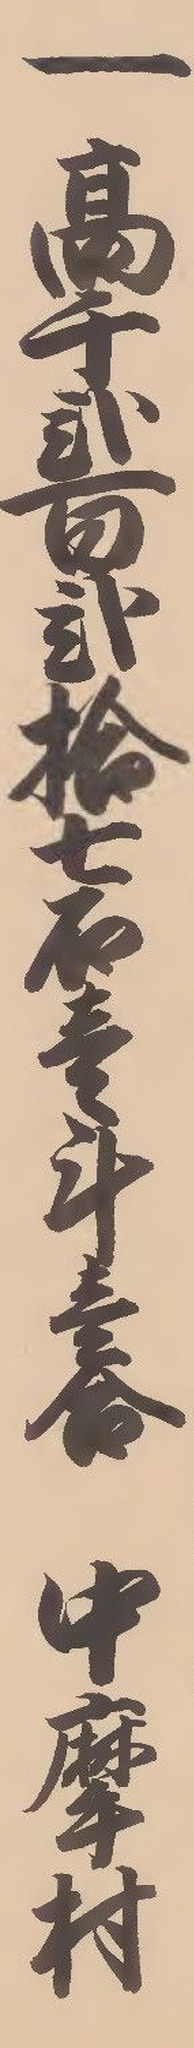一髙千弐百弐拾七石壱斗壱合中摩村
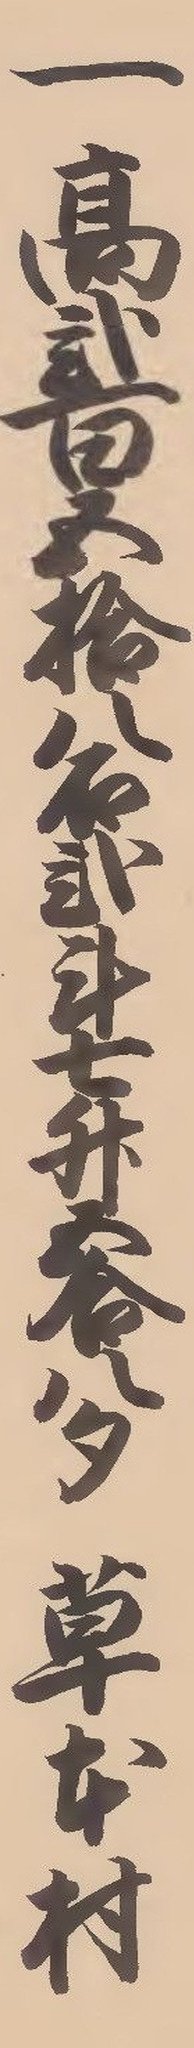一髙弐百五拾八石弐斗七升五合八夕草本村
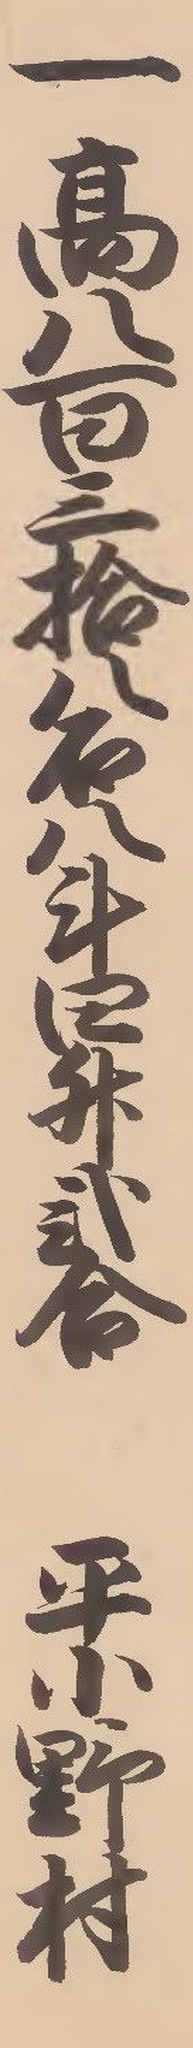一髙八百三拾八石八斗四升弐合平小野村
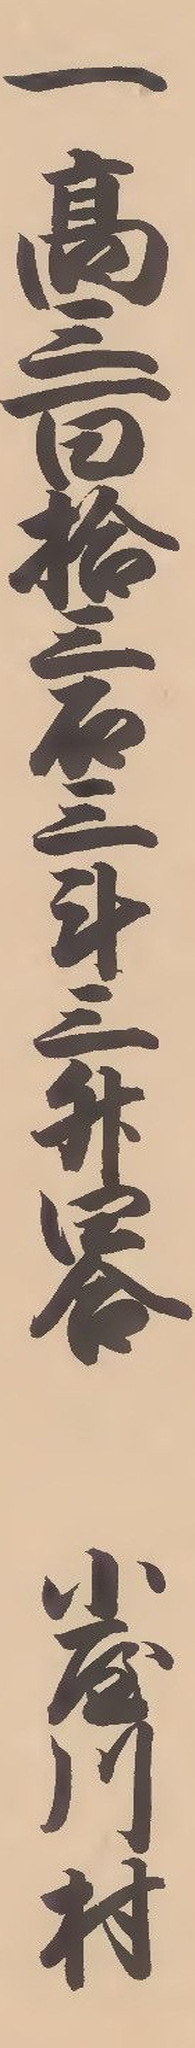一髙三百拾三石三斗三升四合小屋川村
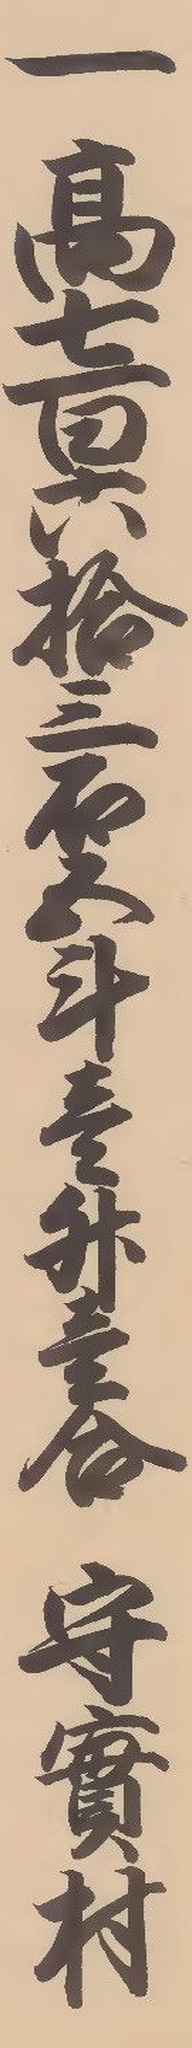一髙七百六拾三石五斗壱升壱合守實村
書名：豊前国郷帳
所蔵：国立公文書館 National Archives of Japan
